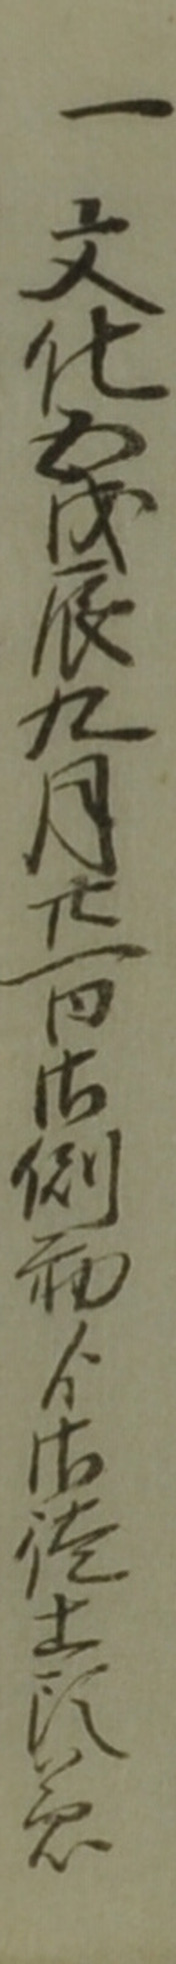一文化五戊辰九月廿一日御側勤ゟ御徒士頭兼
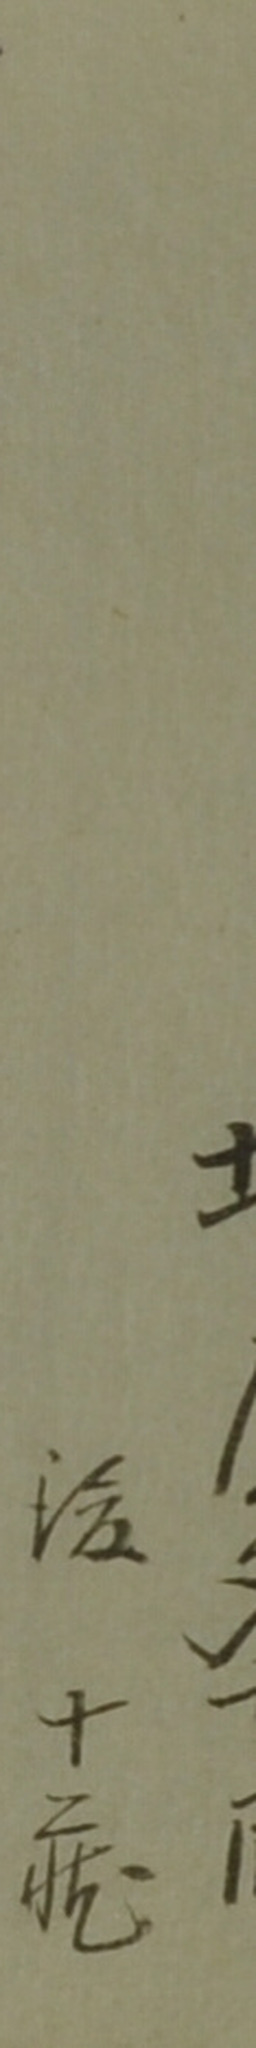後十蔵
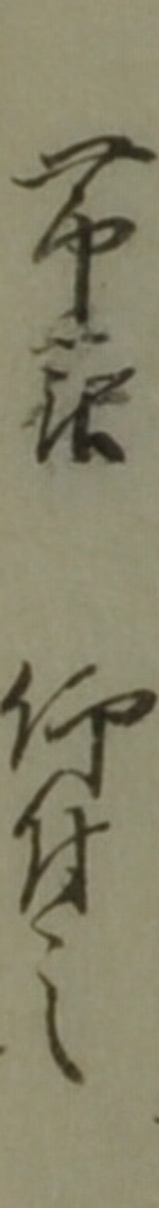帯被仰付之
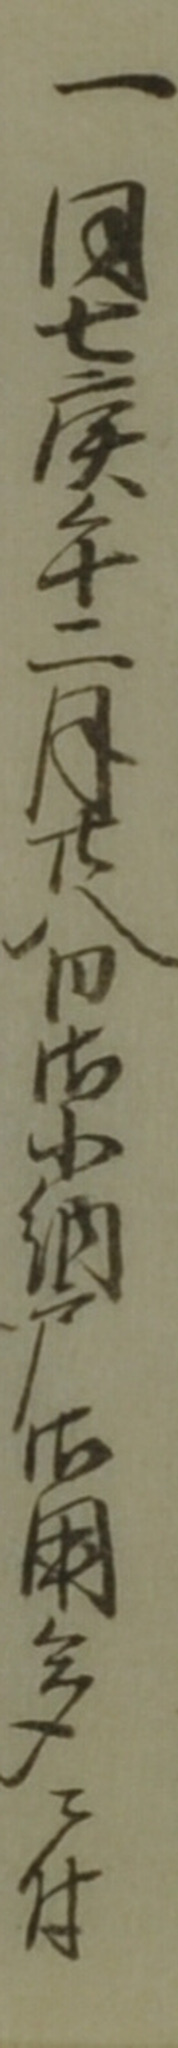一同七庚午二月廿八日御小納戸御用多ニ付
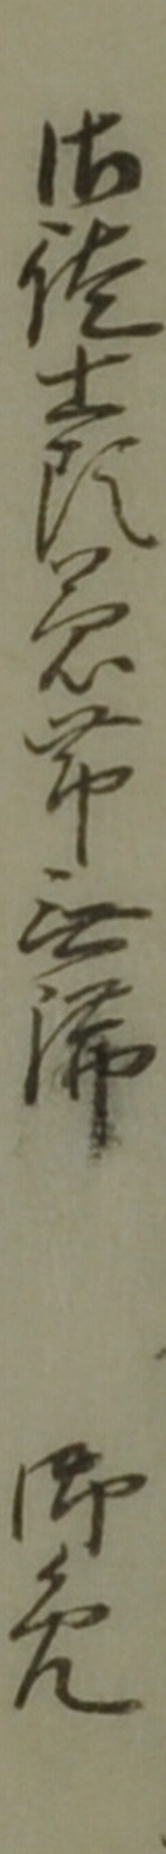御徒士頭兼帯無滞御免
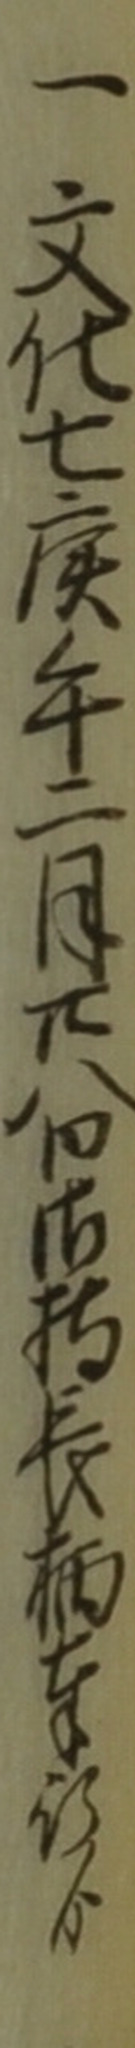一文化七庚午二月廿八日御持長柄奉行ゟ
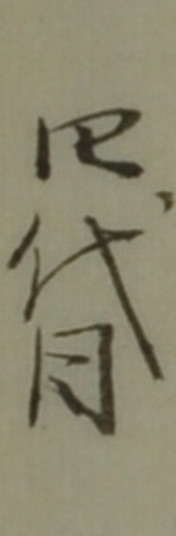四代目
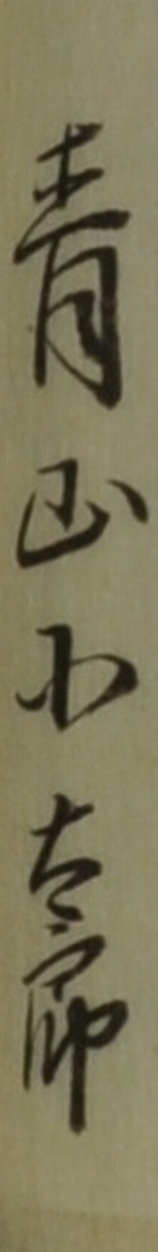青山小太郎
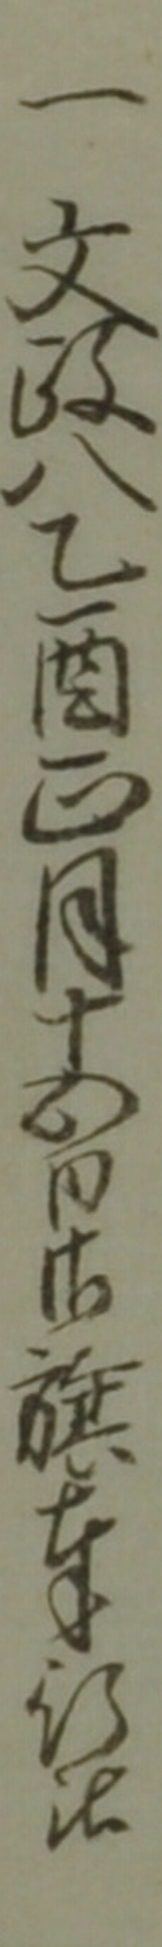一文政八乙酉正月十五日御旗奉行被
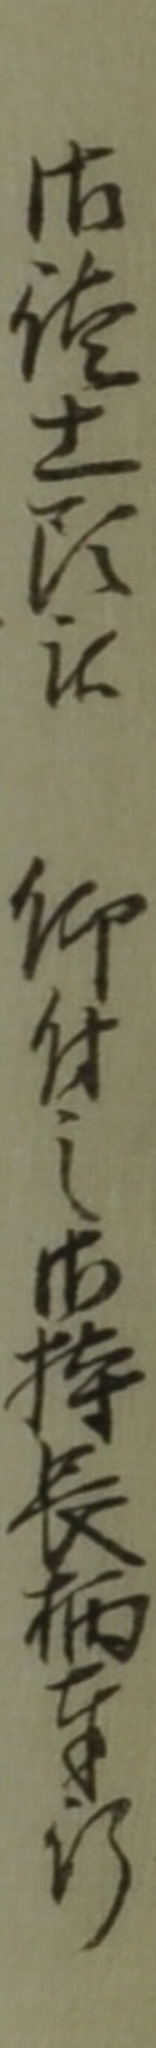御徒士頭被仰付之御持長柄奉行
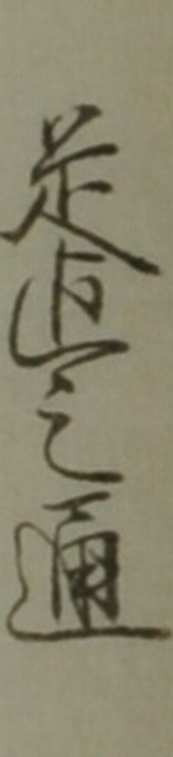是迄之通
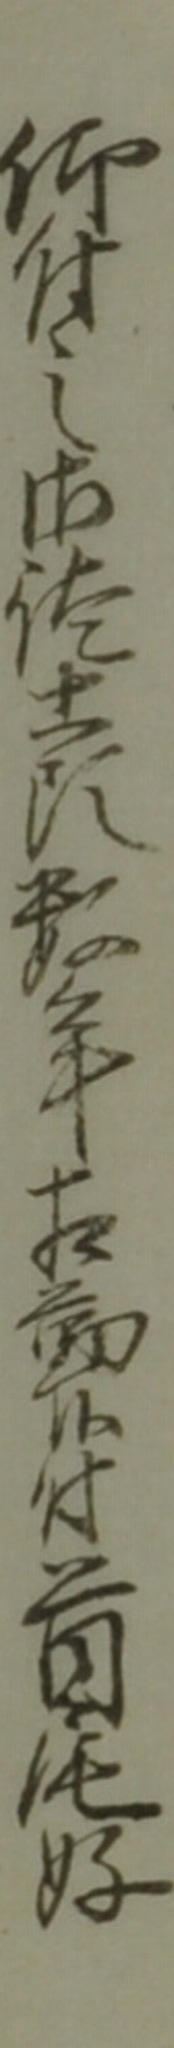仰付之御徒士頭数年相勤候付首尾好
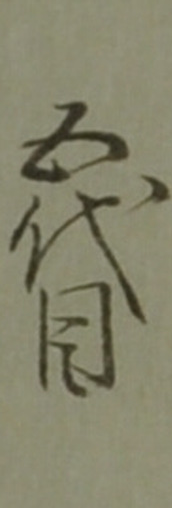五代目
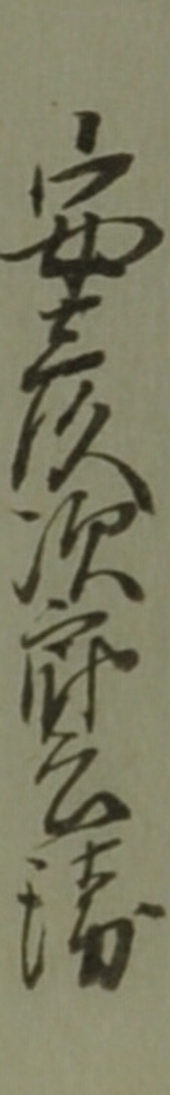安彦次郎兵衛
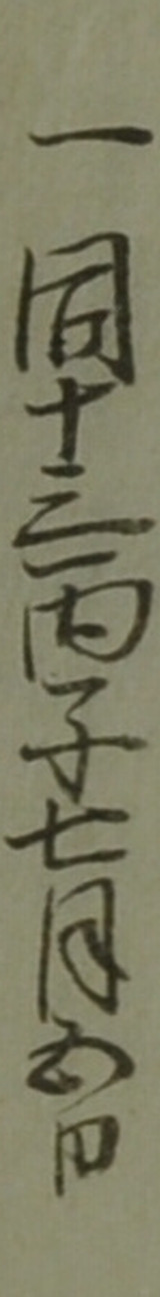一同十三丙子七月五日
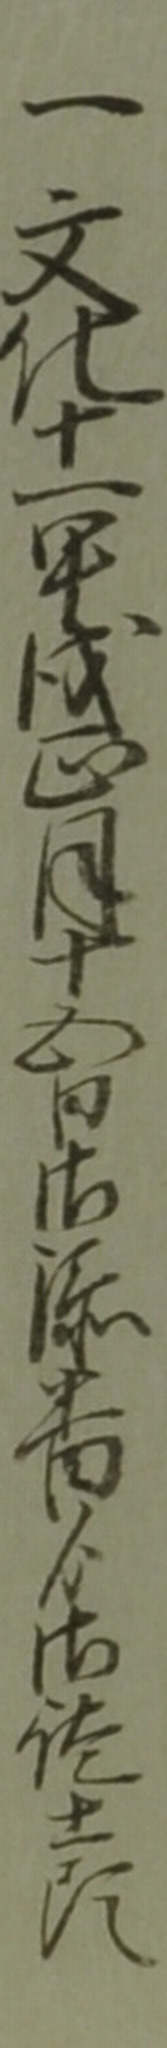一文化十一甲戌正月十五日御添番ゟ御徒士頭
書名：諸御役代々録（六）
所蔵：伊那市立高遠町図書館・合同会社AMANE
